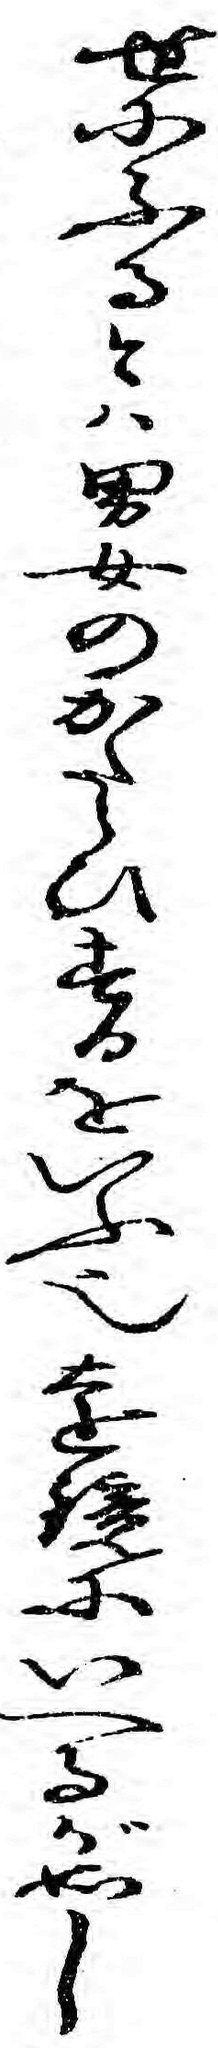世にふるとは男女のかたらひするをいふ也遠鏡にいへるが如し
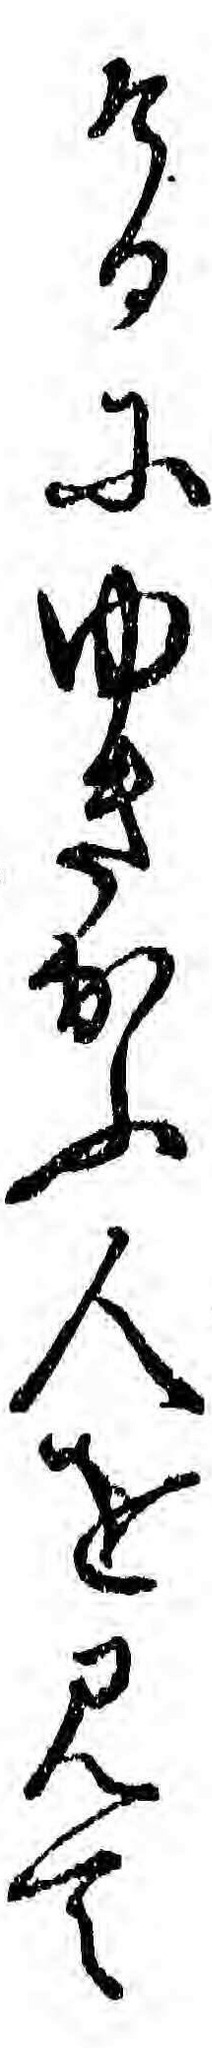けるにゆきかふ人を見て
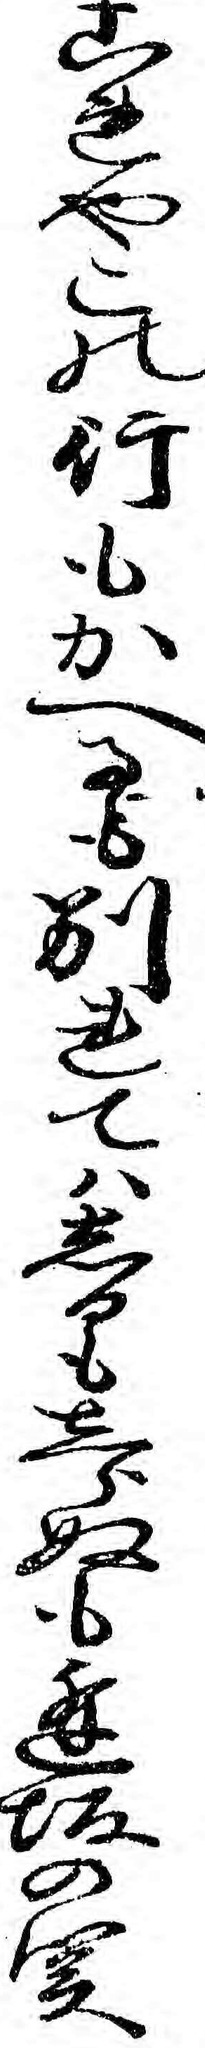これやこの行くもかへるも別れてはしるもしらぬも逢坂の関
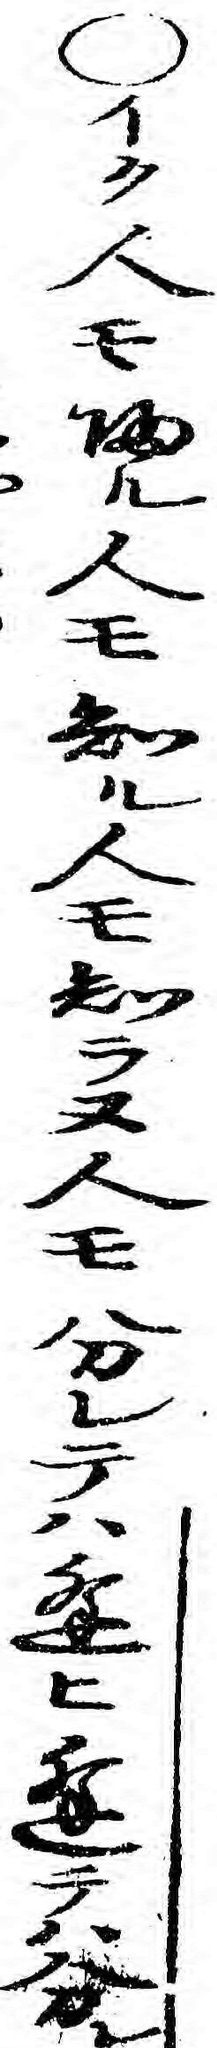○イク人モ帰ル人モ知ル人モ知ラヌ人モ分カレテハ逢ヒ逢テハ分
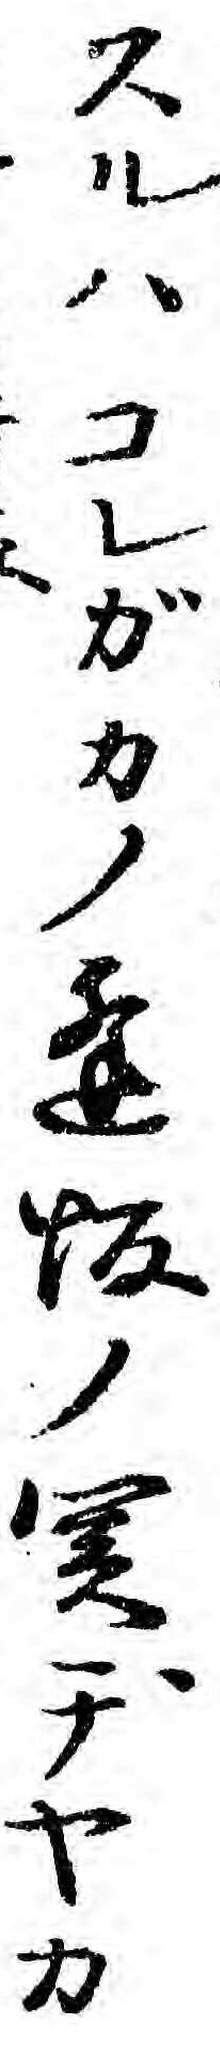スルハコレガカノ逢坂ノ関ヂヤカ
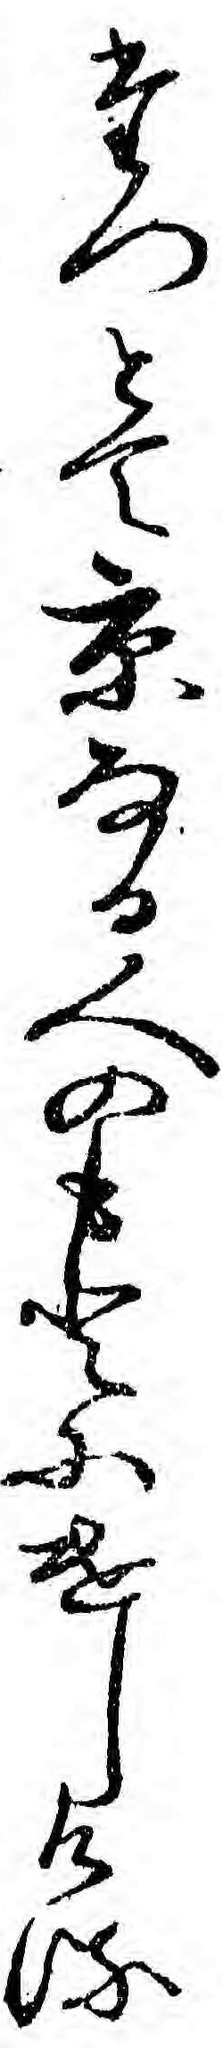たつとて京なる人のもとに遣しける

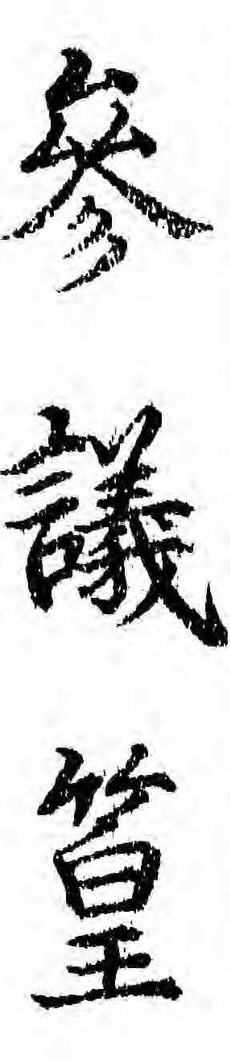参議篁
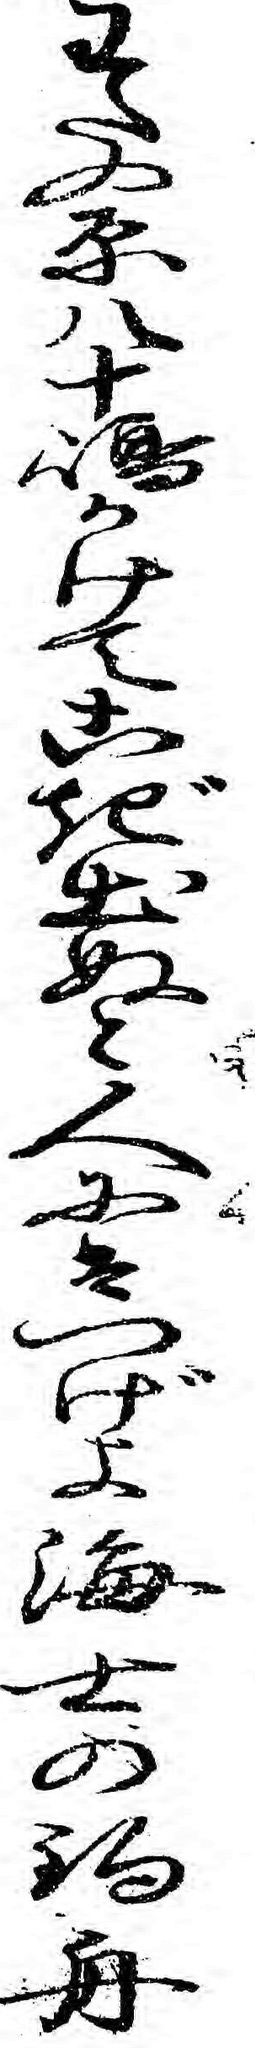わたの原八十嶋かけてこぎ出ぬと人にはつげよ海士の釣船
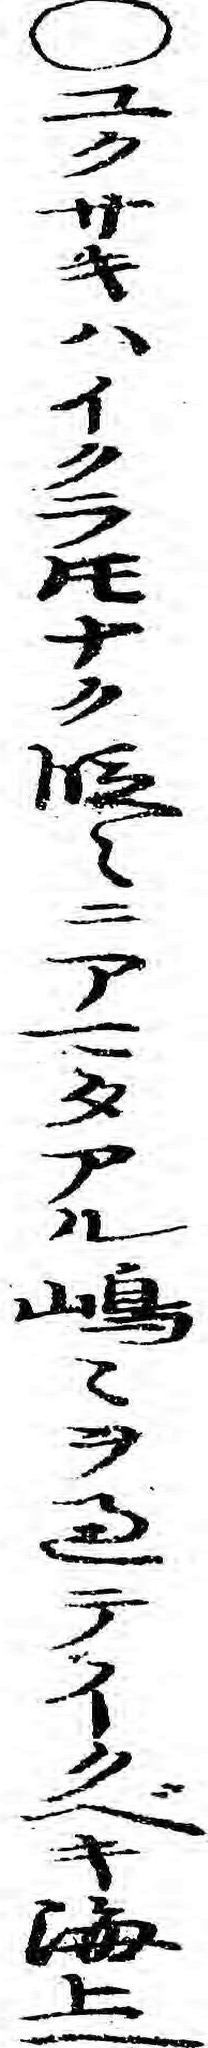○ユクサキハイクラトモナク段々ニアマタアル嶋々ヲ過テイクベキ海上ヘ
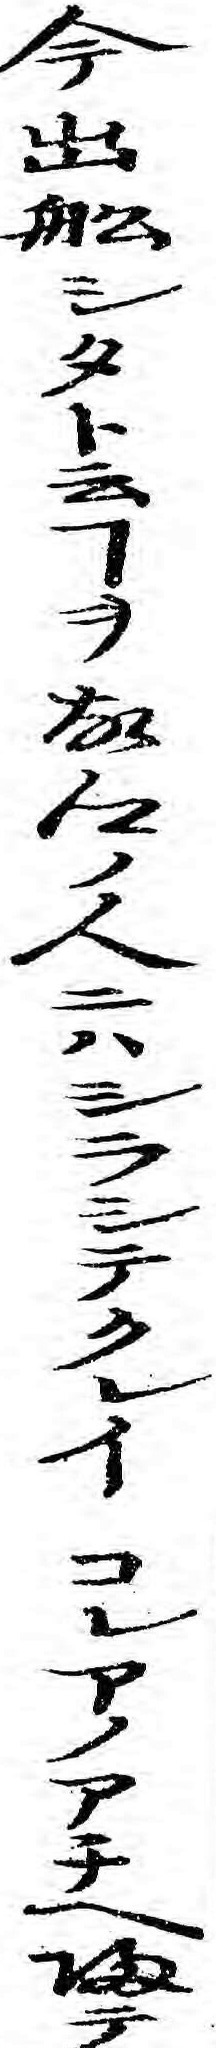今出船シタト云コトヲ故郷ノヒトニハシラシテクレイコレアノアチヘ帰テ
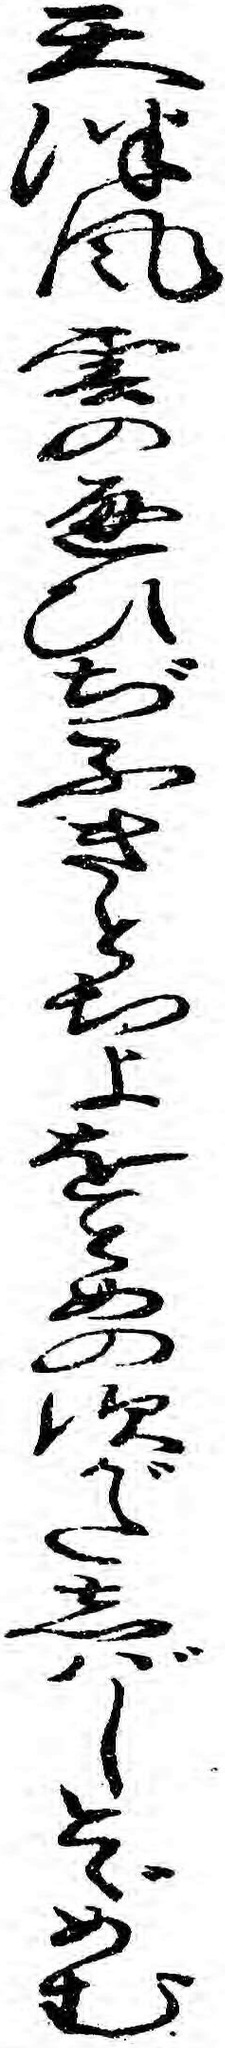天津風雲の通ひぢふきとちよをとめのすがたしばしとゞめむ
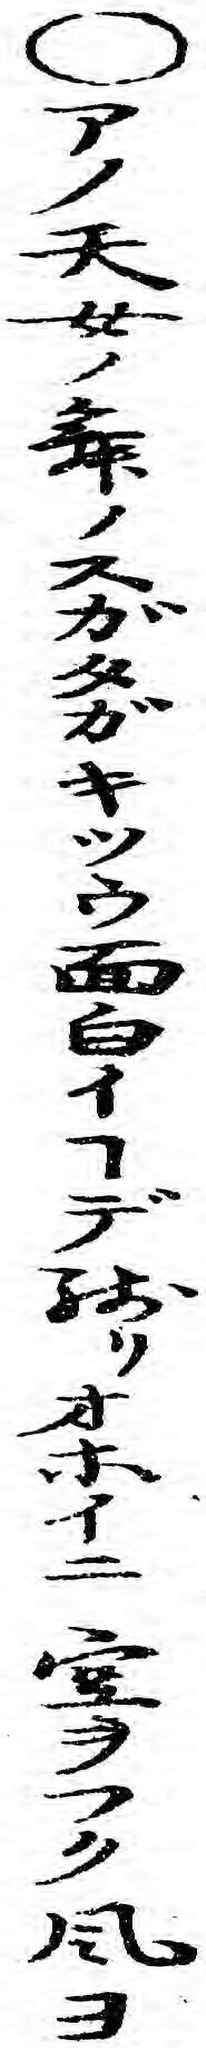○アノ天女ノ舞ノスガタガキツウ面白イコトデ残リオホイニ空ヲフク風ヨ
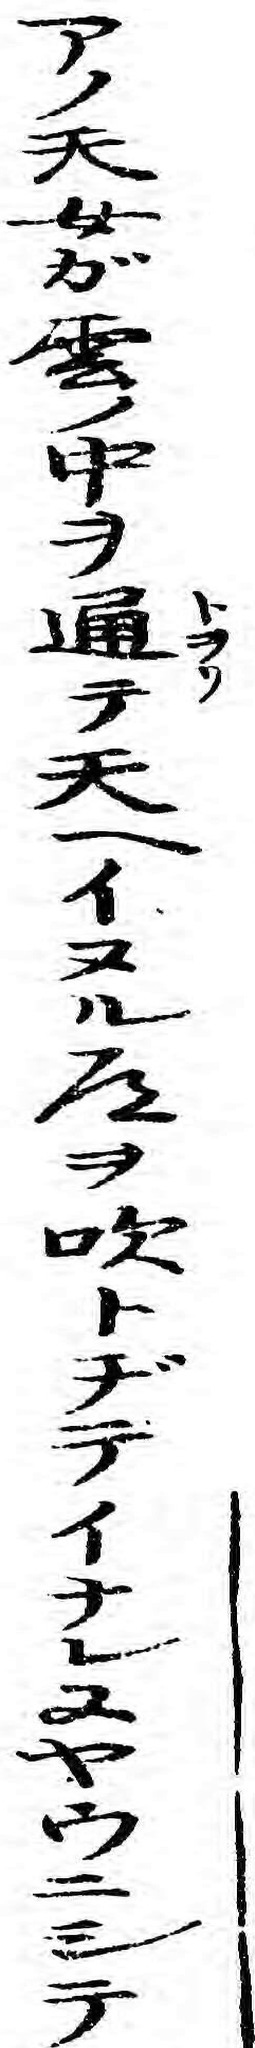アノ天女ガ雲ノ中ヲ通テ天ヘイヌル道ヲ吹トヂテイナレヌヤウニシテ
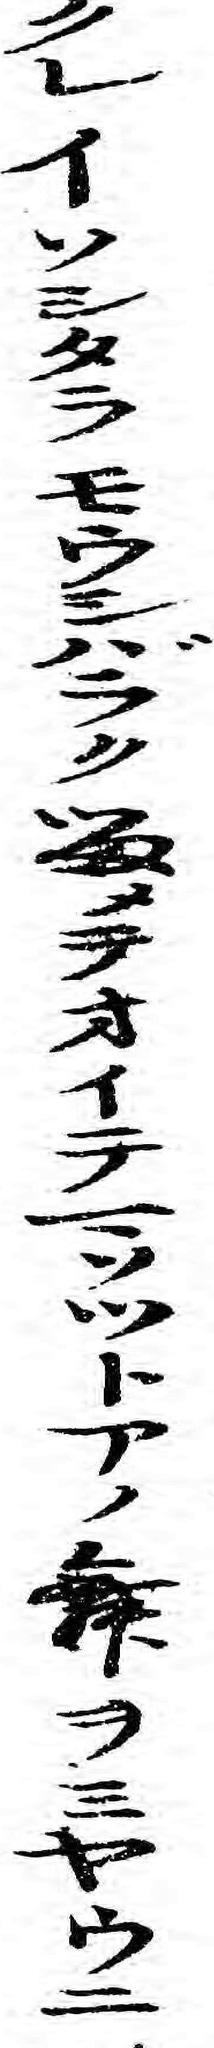クレイソシタラモウシバラク留メテオイテマソツトアノ舞ヲミヤウニ
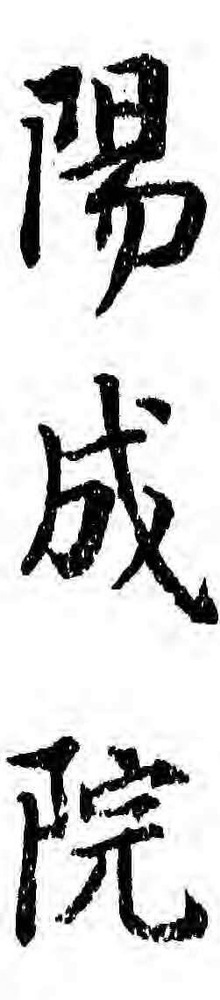陽成院
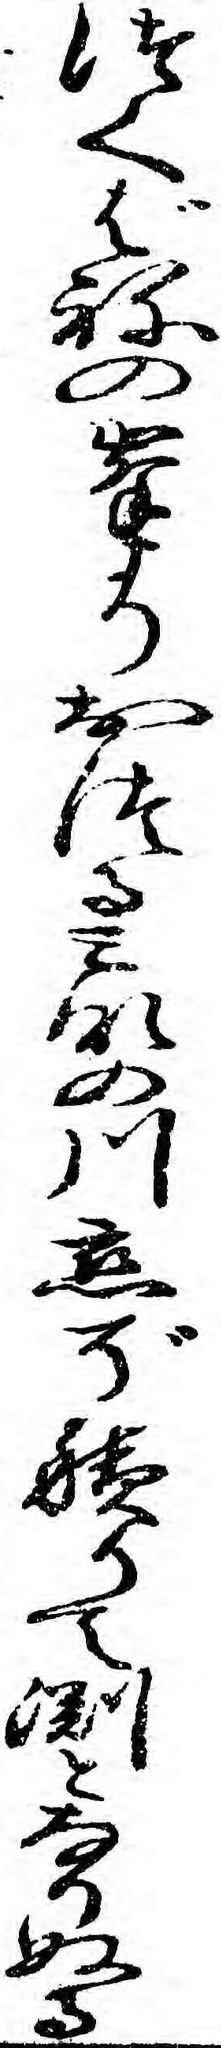つくばねの峯よりおつるみなの川恋ぞ積りて渕となりぬる
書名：百人一首／小倉の山ふみ
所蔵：国文学研究資料館
